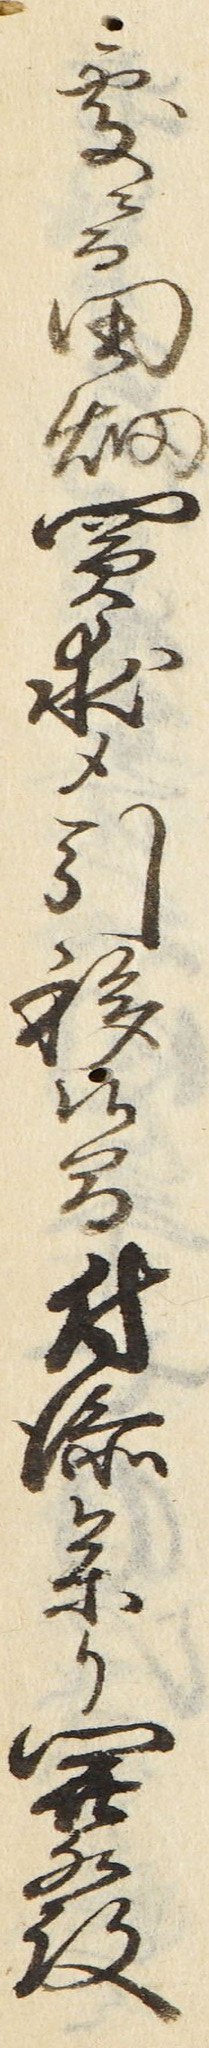處ニ而田畑買求メ引移候間付添参り開發

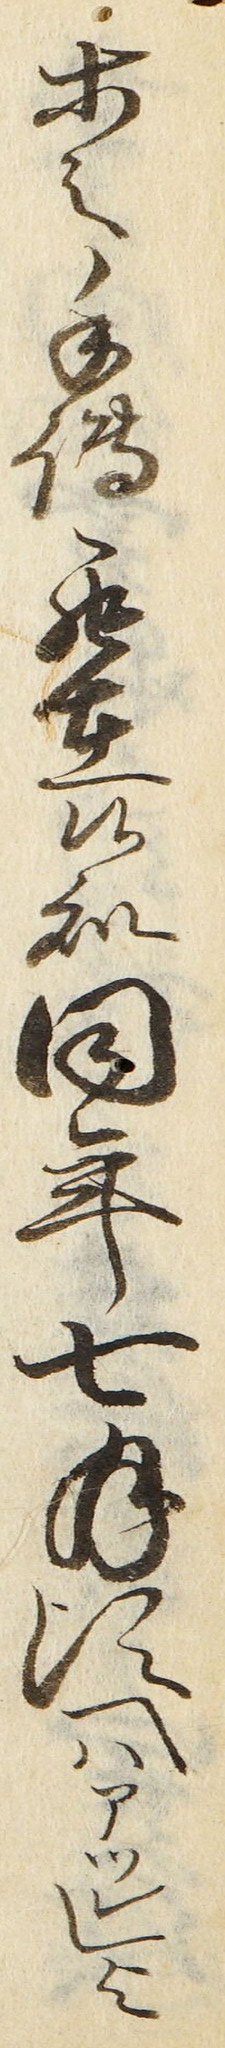等之手傳罷在候処同年七月頃「ハアツレ」と
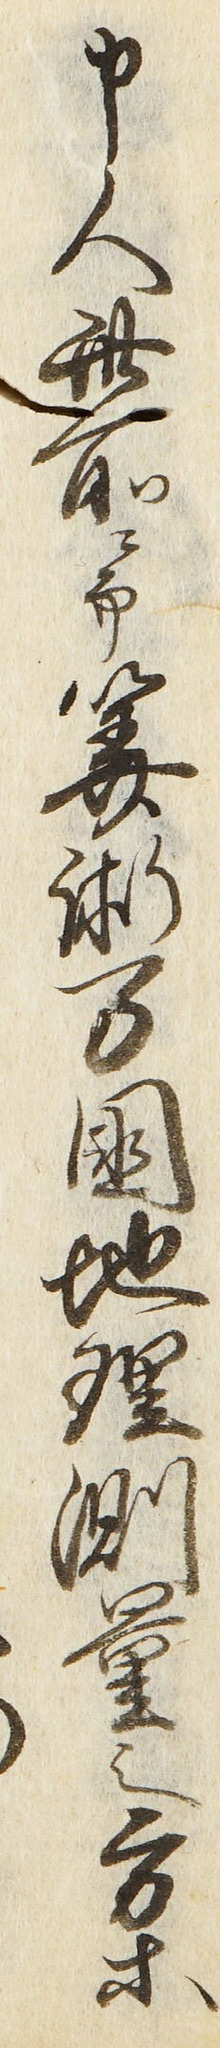申人此所ニ而算術万國地理測量之方等
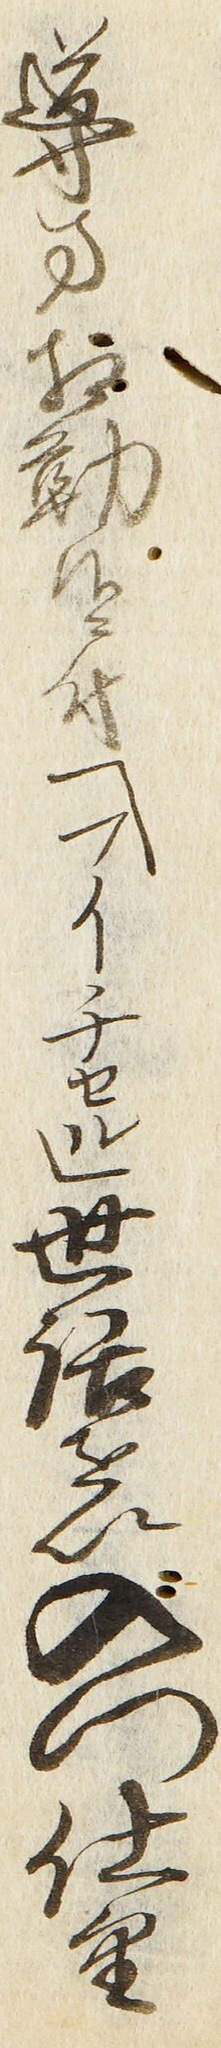導方相勤候ニ付「フイチセル」世話を以入門仕り
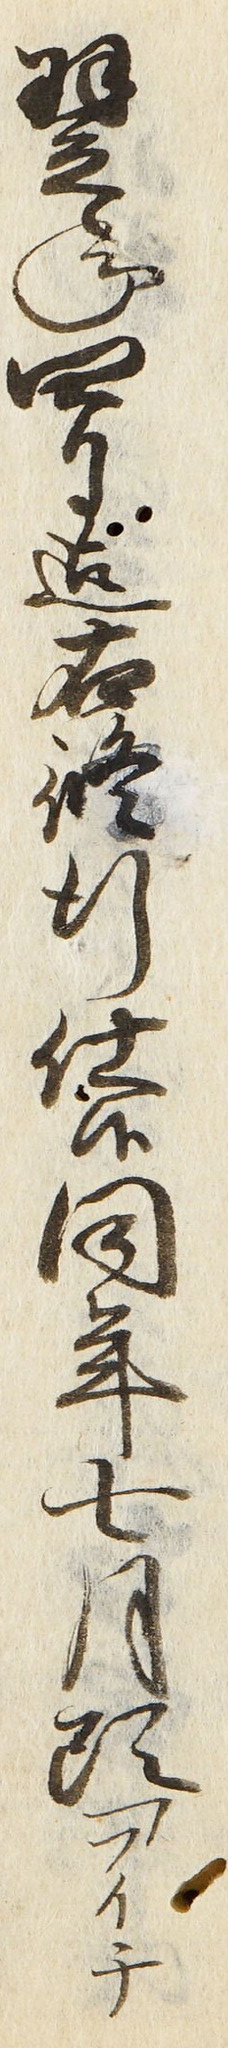翌年四月迄右修行仕候同年七月頃「フイチ
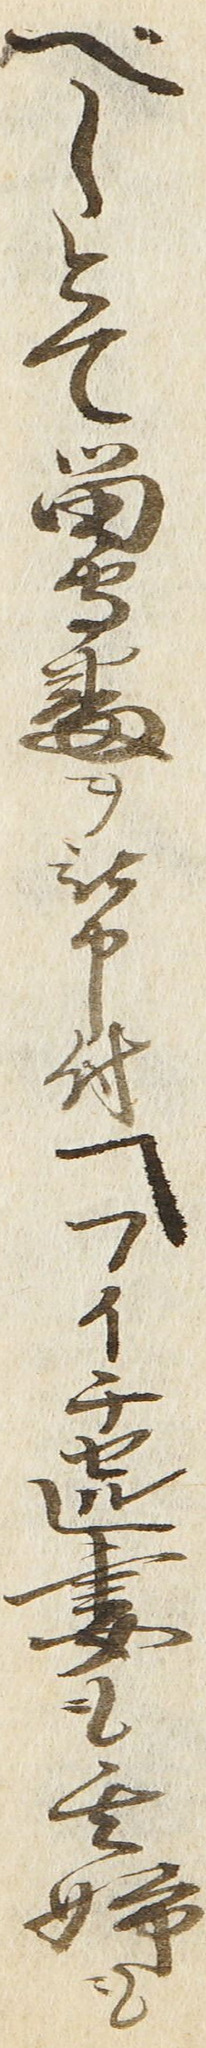べしとて留守番ヲ被申付「フイチセル」妻も其姉も
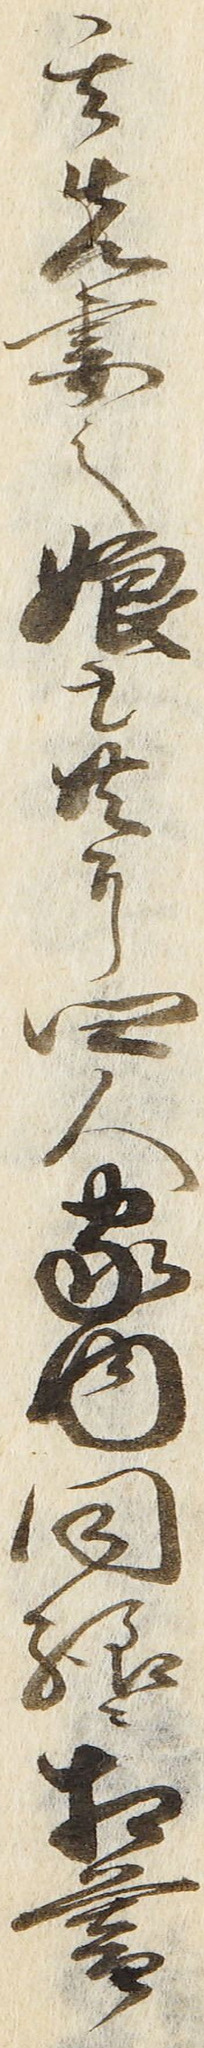其先妻之娘も共に四人家内同様ニ相暮
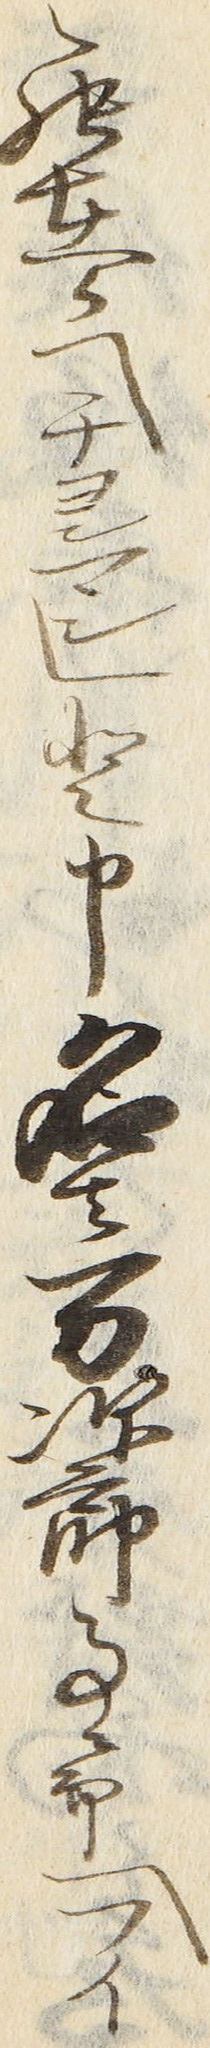罷在候「チヨンマン」と申名者万次郎事ニ而「フイ
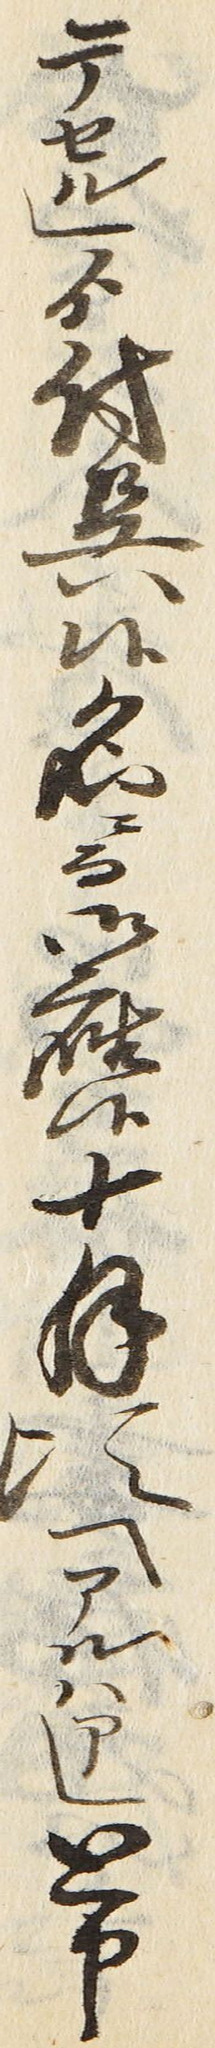テセル」ゟ付呉候名ニ而御座候十月頃「アルハア」と申
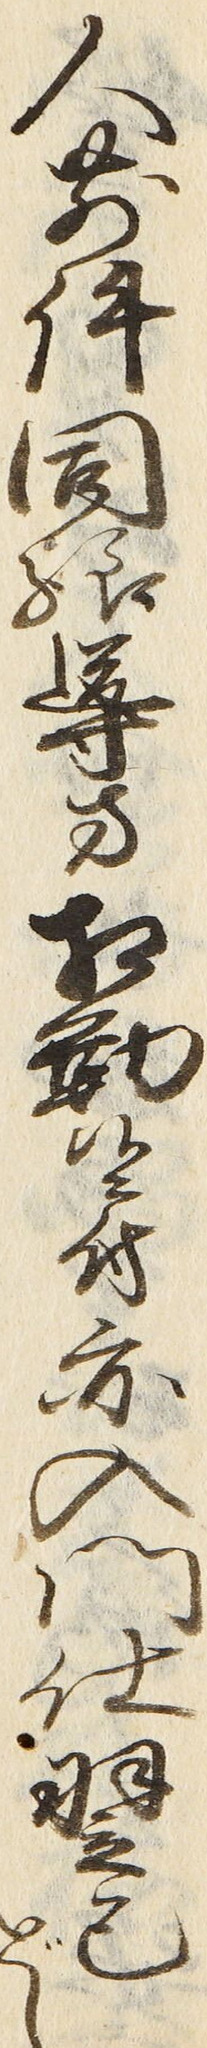人前件同様導方相勤候ニ付亦入門仕翌巳どし
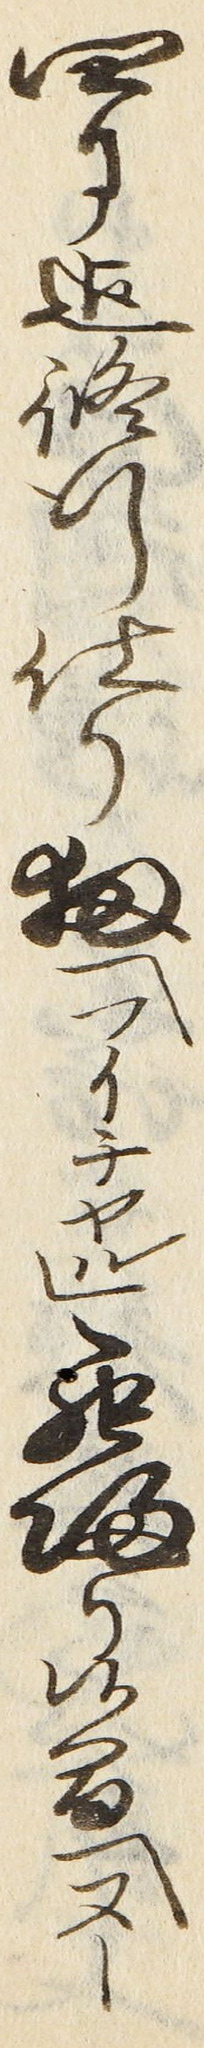四月迄修行仕り扠「フイチヤル」罷帰り候間「ヌー
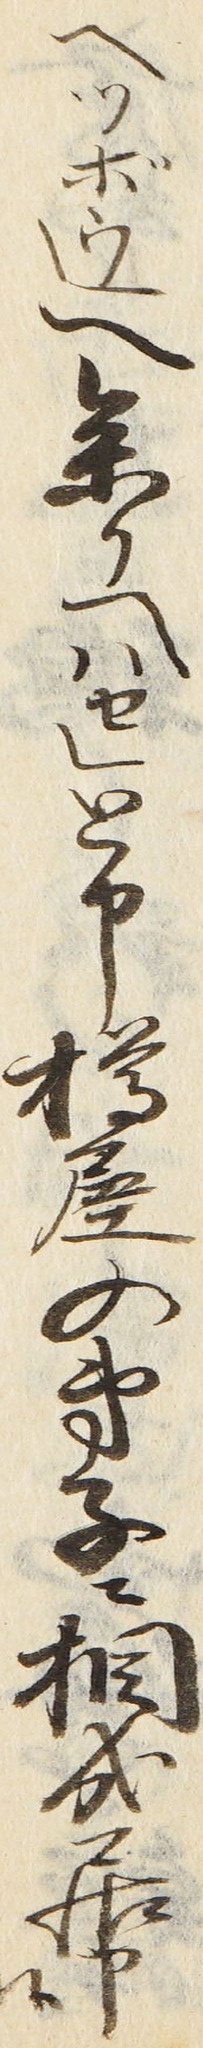ヘツボウ」へ参り「ハセ」と申樽屋の弟子ニ相成居申候
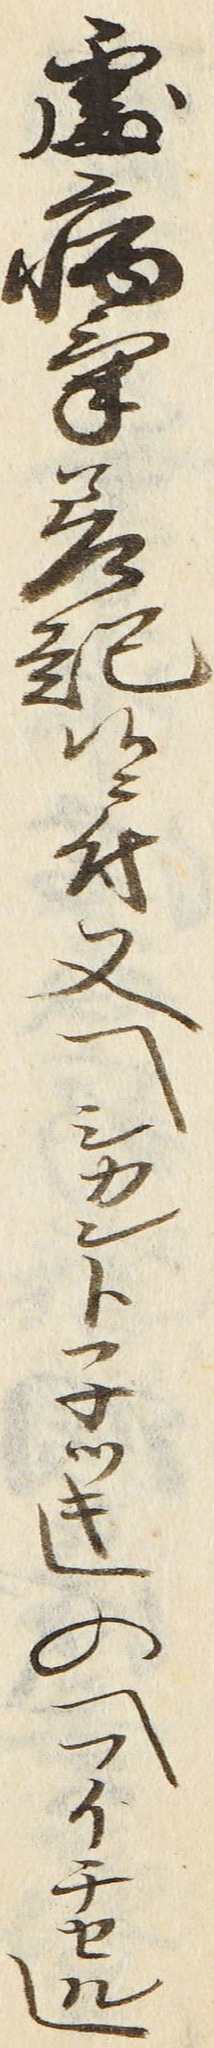處病気差起候ニ付又「シカント子ツキ」の「フイチセル」
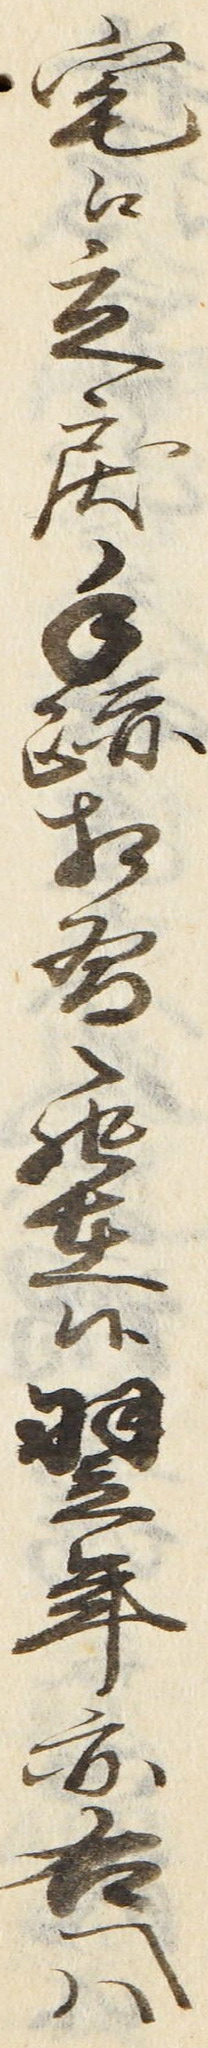宅江立戻手跡相習罷在候翌年亦右「ハ
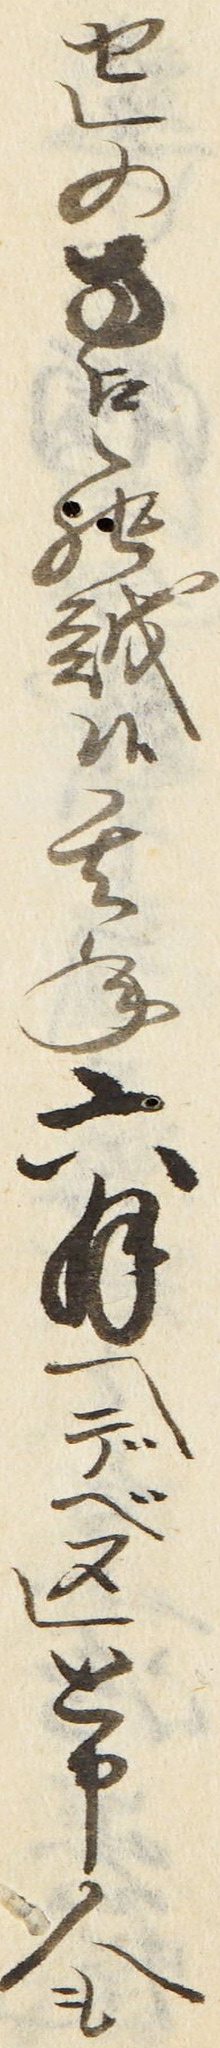セ」之方江罷越候其年六月「デべヌ」と申人も
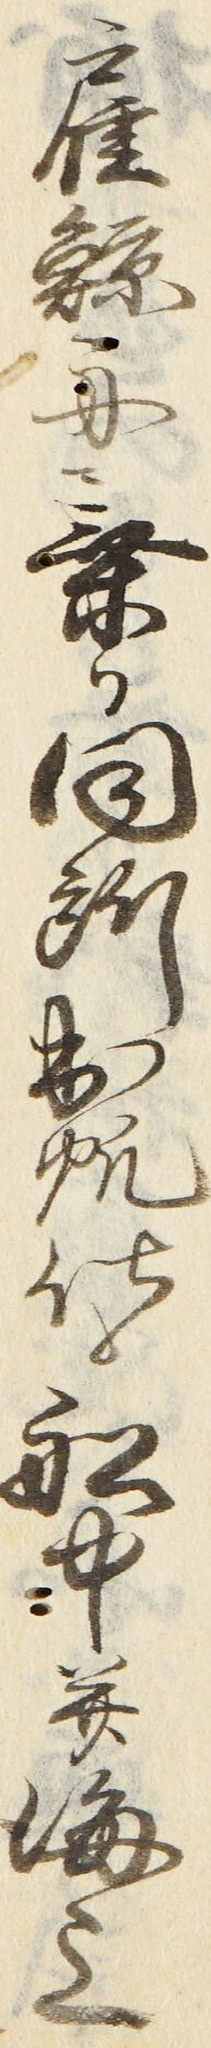雇鯨舟ニ乗り同所出帆仕候舩中幷海上
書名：漂客談寄
